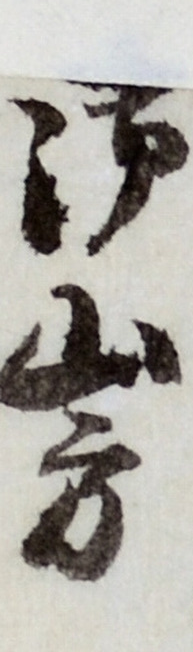御山方
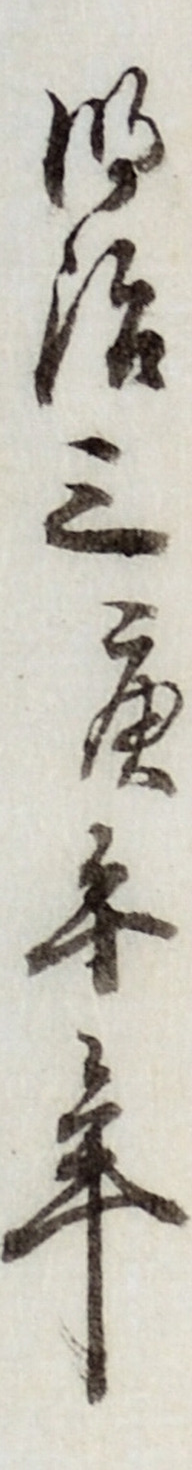明治三庚午年
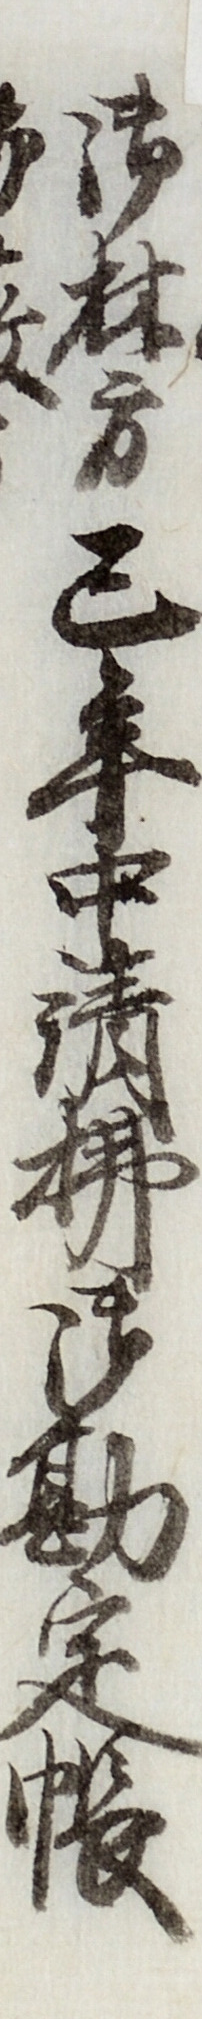御林方巳年中請払御勘定帳
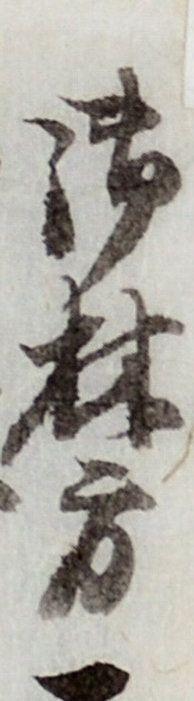御山方
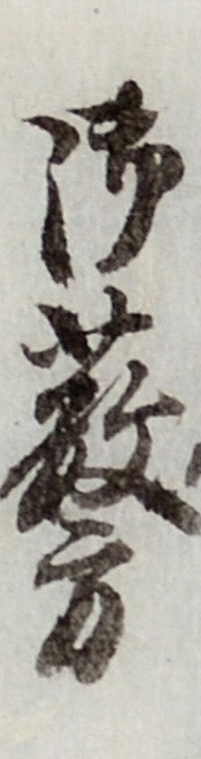御山方
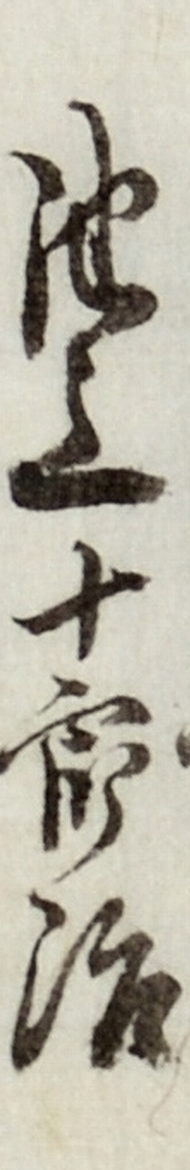池上十郎治
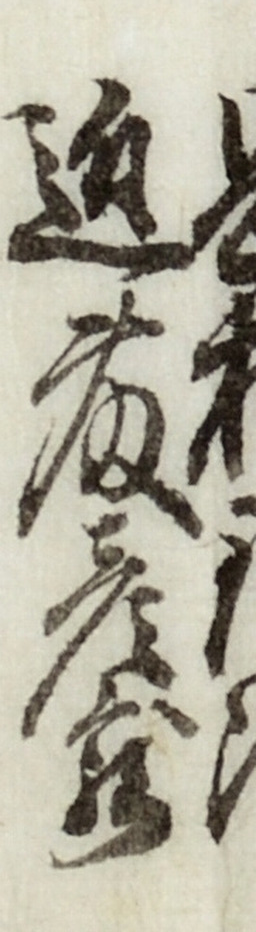近藤彦蔵

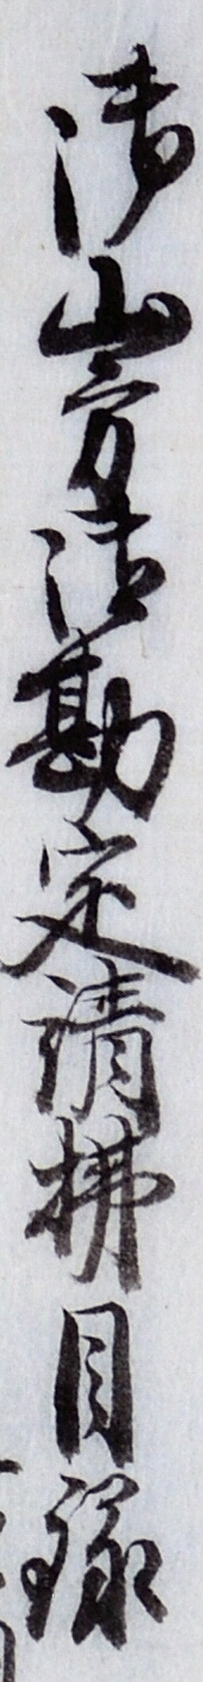御山方御勘定清払目録
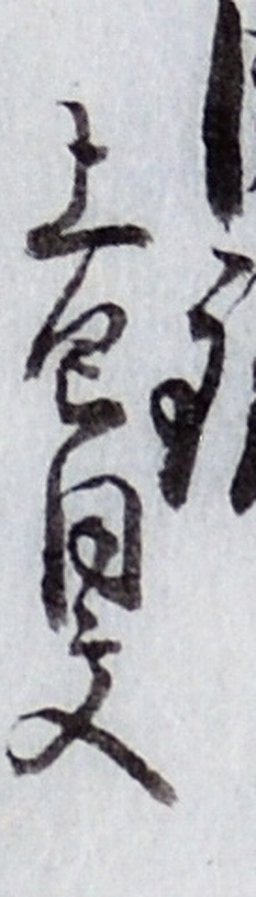上包同文
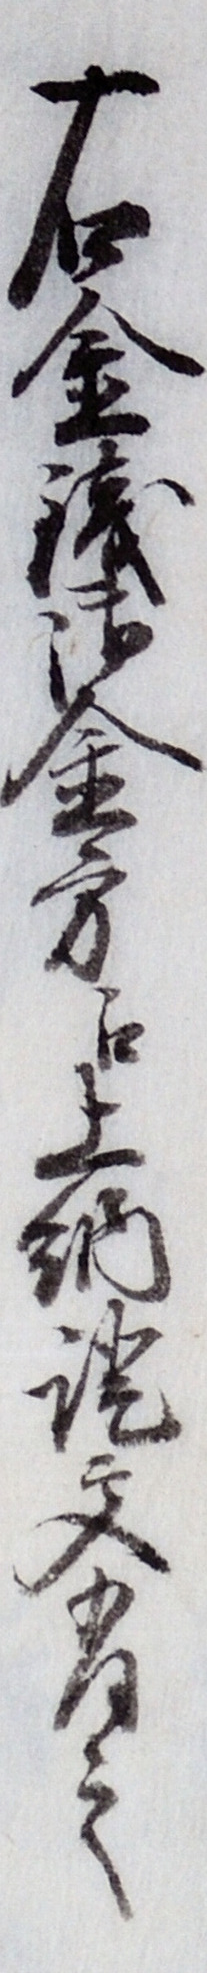右金銭御金方江上納証文有之
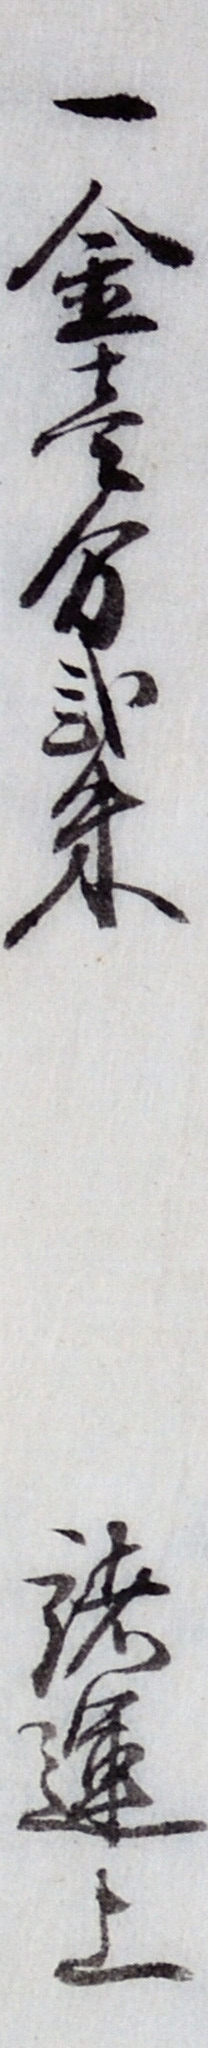一金壱分弐朱諸運上
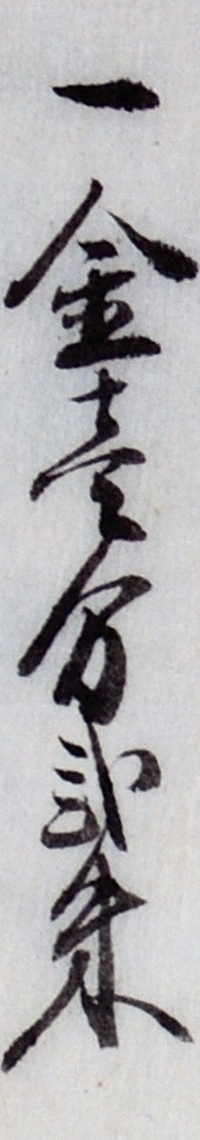一金壱分弐朱諸運上
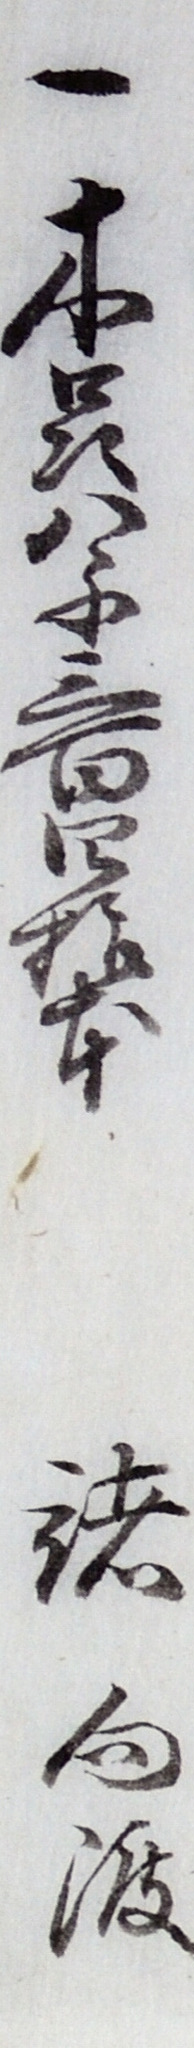一木品八千三百四拾本諸向渡

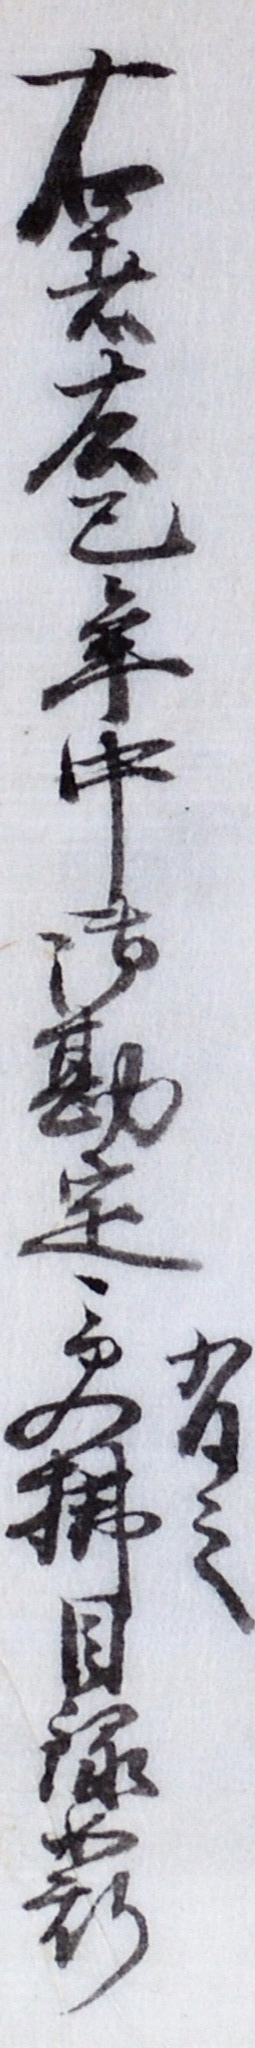右者去巳年中御勘定受払目録如斯
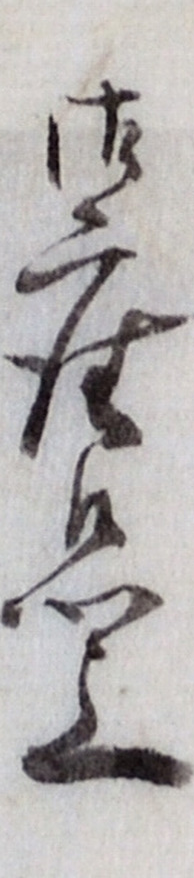御座候以上
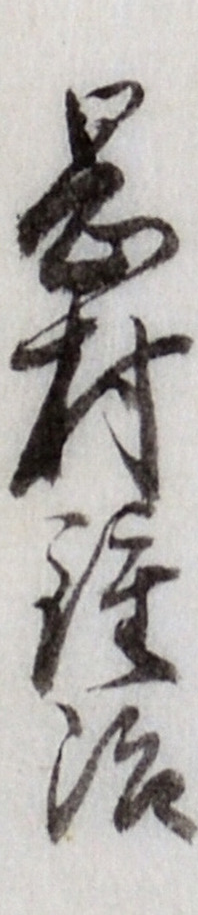岡村鍾治
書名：御山方御林方御藪方巳年中請払御勘定帳
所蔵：伊那市立高遠町図書館・合同会社AMANE
